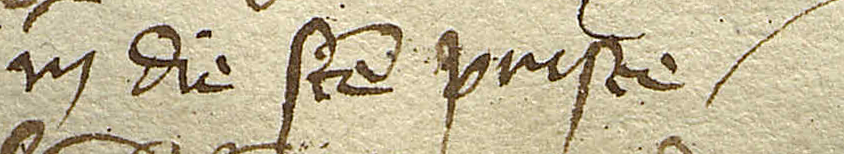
in* die ſce* priſce /
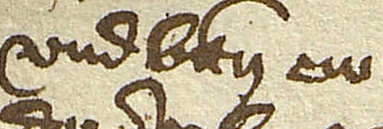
vnd bitn* ew
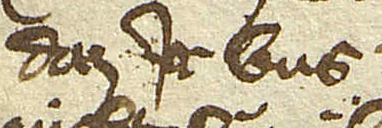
daʒ Ir vns
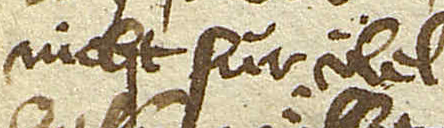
nicht für bel
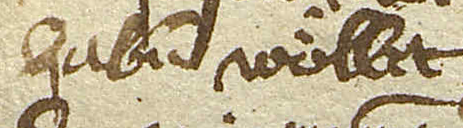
habn* wöllet
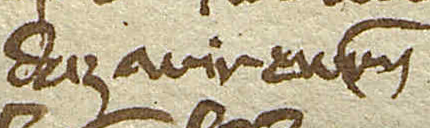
daʒ wir ewrn*
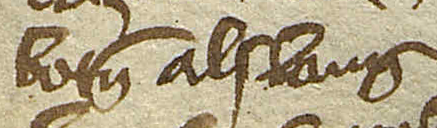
botn* alſlang
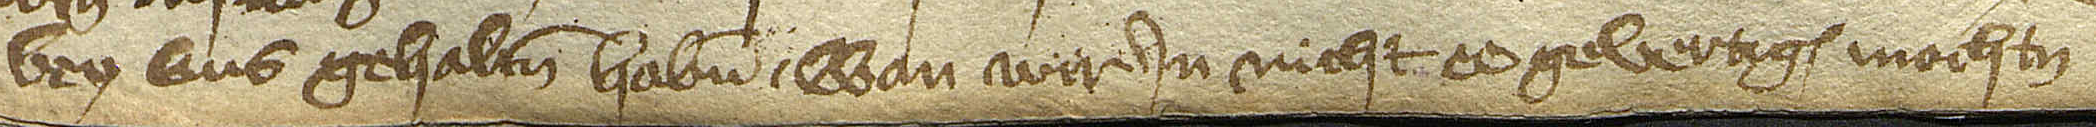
bey vns gehaltn* habn* / wan wir In nicht ee gevertig* mochtn*
